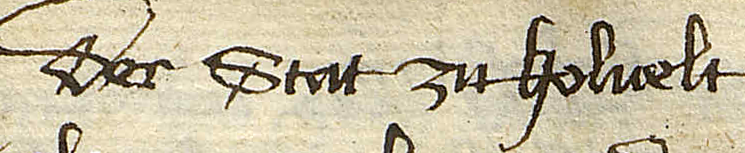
Der Stat ʒu Holuelt
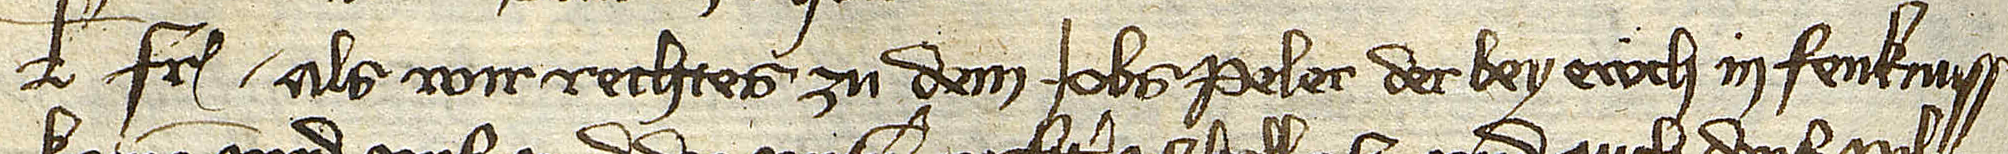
L* Fr* / als wir rechtes ʒu dem Iobs Peler der bey ewch in fenknuſſ
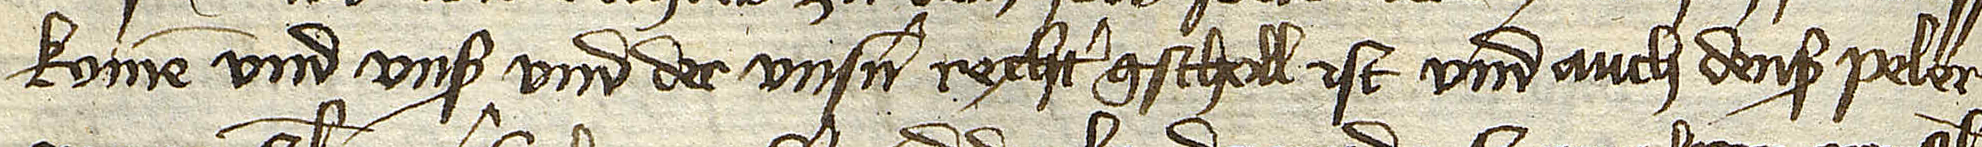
kome* vnd vnſ* vnd der vnſ*n recht* gſcholl iſt vnd auch denſ* peler
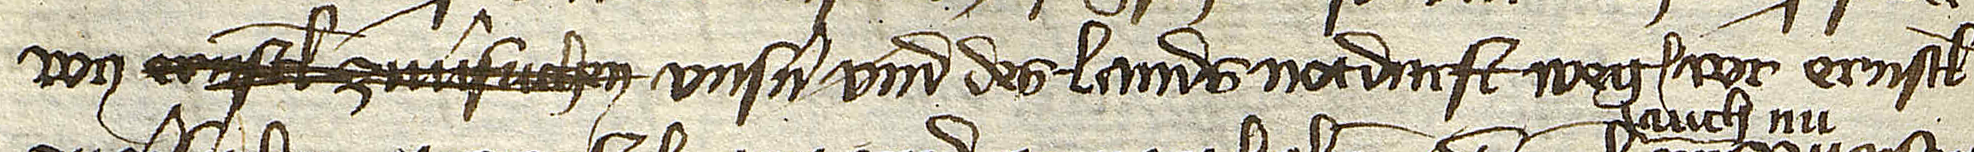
von ernſtl* ʒuu*ſuchen vnſ*n vnd des Lands notdurft weg* vor ernſtl* /
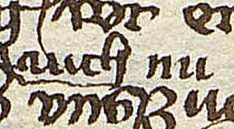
auch nu
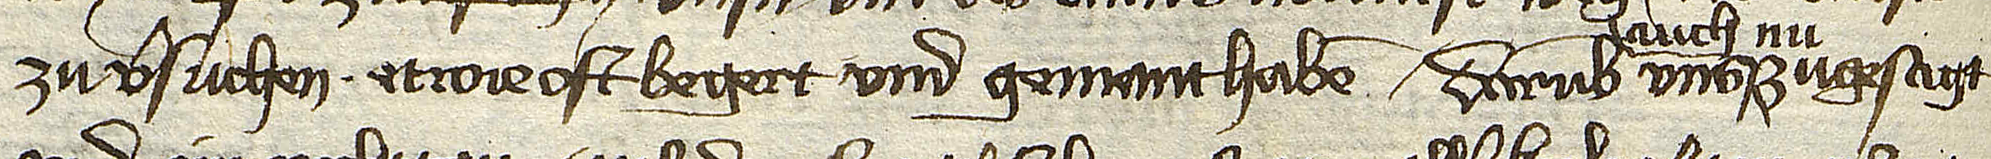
ʒuv*ſuchen . etwieoft begert vnd gemant habte / Daru*b vns ʒugeſagt
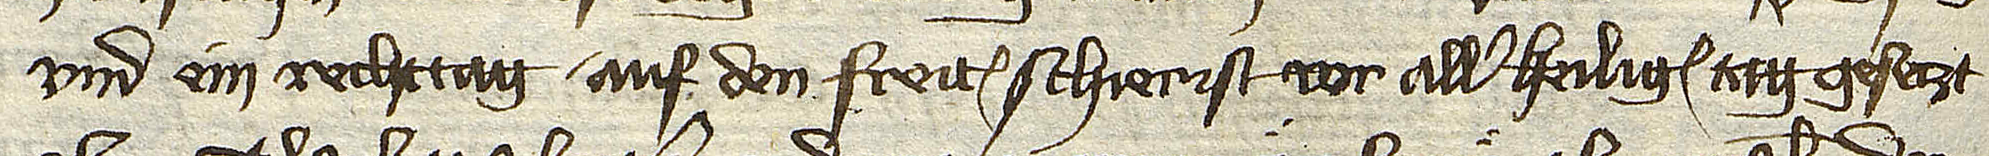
vnd ein rechttag / auf den freit* ſchieriſt vor all* heilig* tag geſecʒt
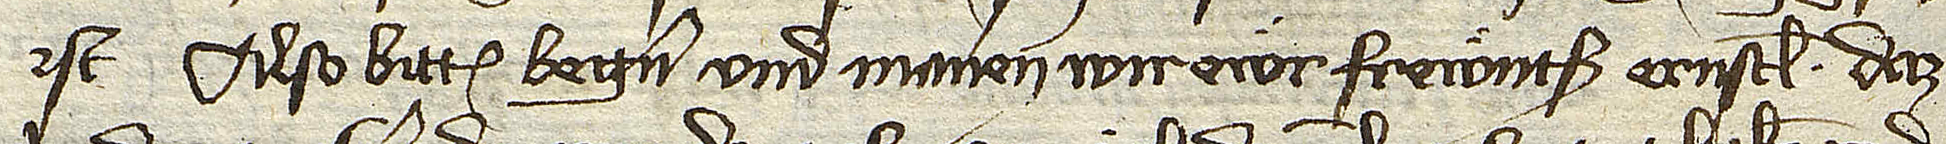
iſt Alſo bitt* begn* vnd manen wir ewr frewntſ* ernſtl* . daʒ
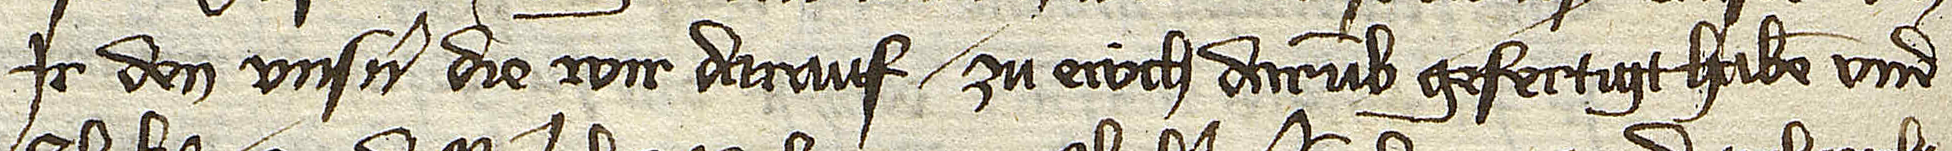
Ir den vnſn* die wir darauf / ʒu ewch daru*b gefertigt habe* vnd
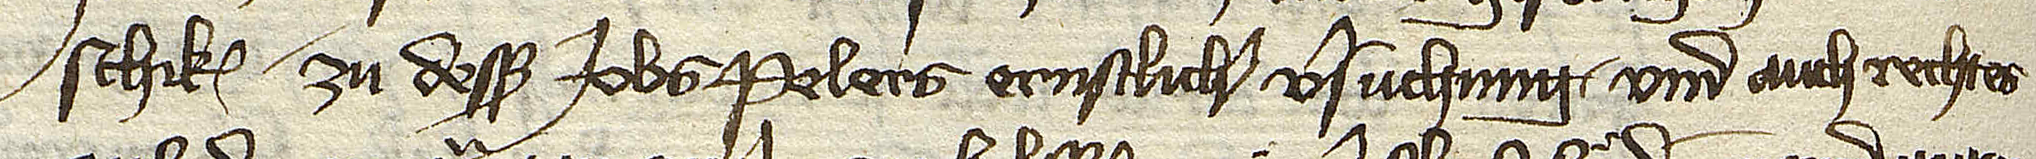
ſchik* / ʒu deſſ* Iobs Pelers ernſtlich* v*ſuchung / vnd auch rechtes
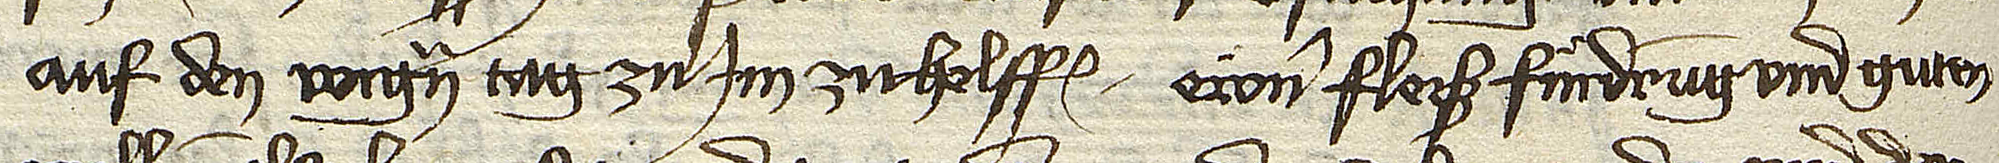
auf den vorgn* tag ʒu Im ʒuhelff* / ewn* fleiſʒ fürdru*g vnd guten
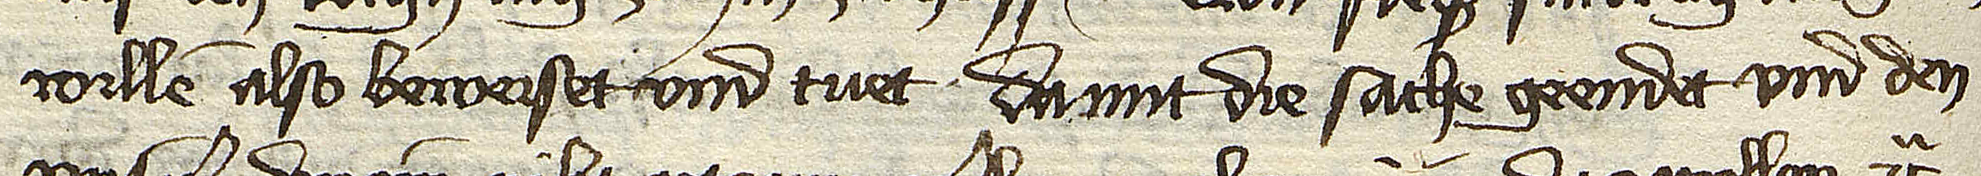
wille* alſo beweiſet vnd tuet . Damit die ſache geendet vnd den
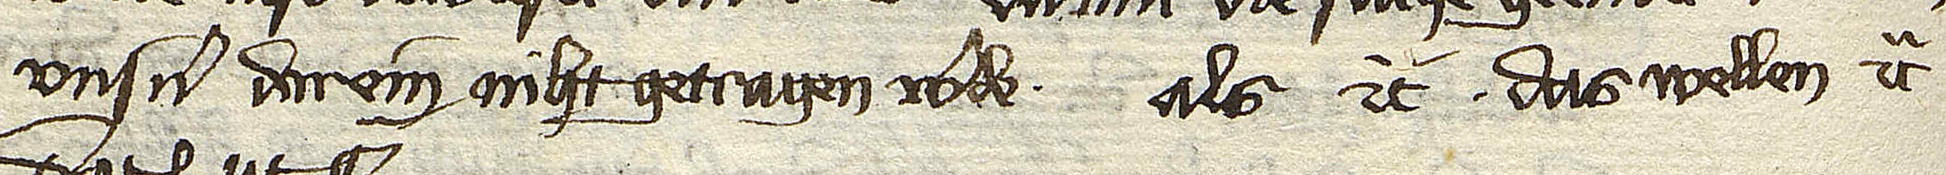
vnſ*n darein niht getragen w*de . als ec* . das wellen ec*
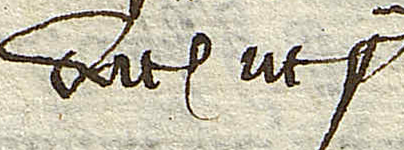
Dat* ut ſ*
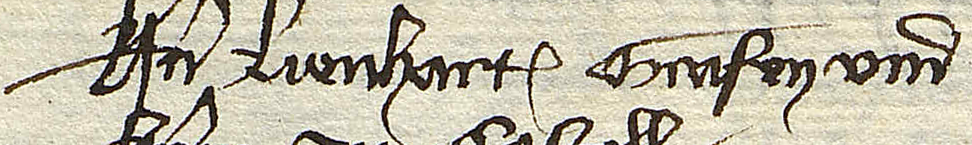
H*n Lienhart* Grafen vnd
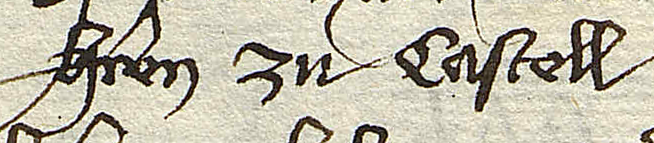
Hren* ʒu Caſtell
